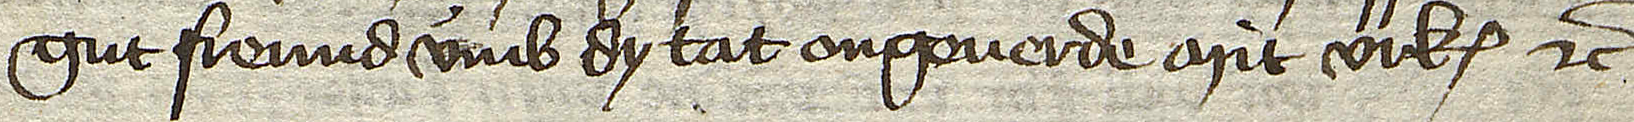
gut freund v̈mb dy tat ongeuerde Mit vrk* ec*
